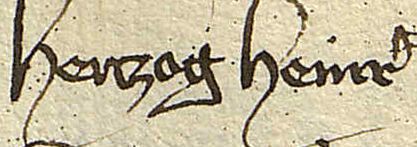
hercʒog heinr*
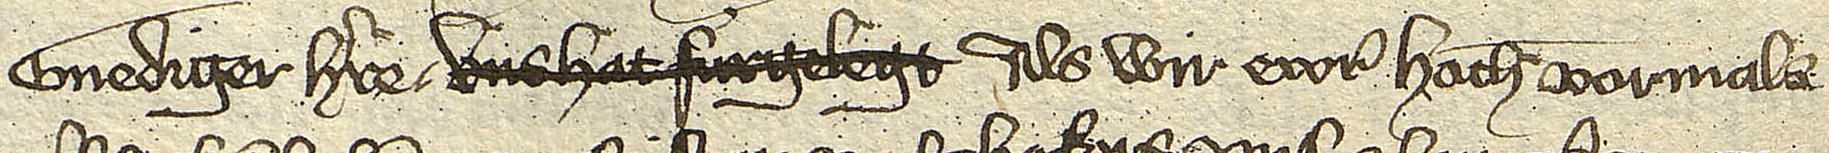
Gnediger h*re / vns hat fürgelegt Als wir ewr* hoch* vormals
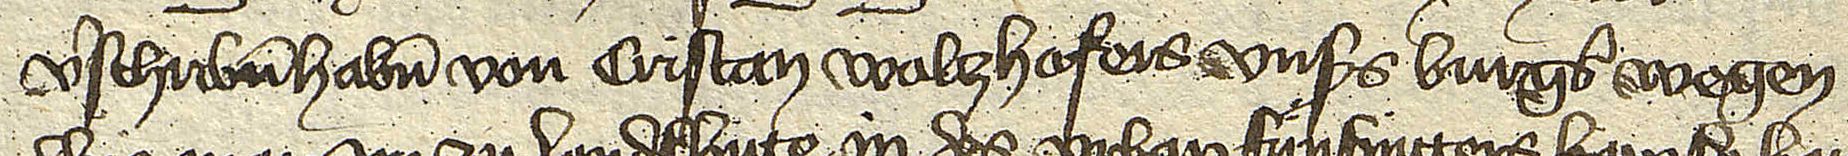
v*ſchribn* habn* von Criſtan wolcʒhofens vnſ*s burgs* wegen
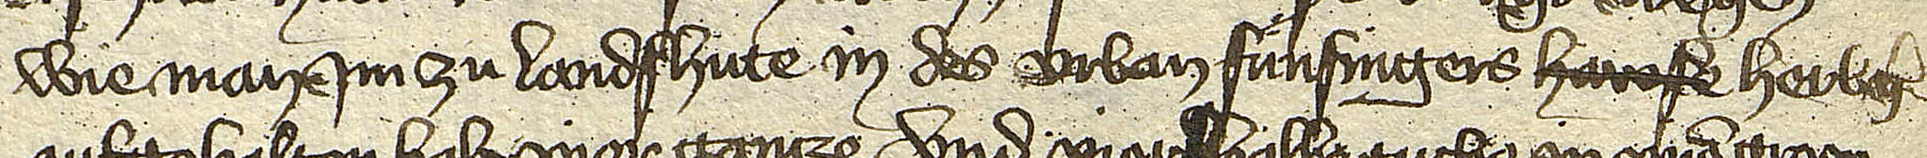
wie man Im cʒu landſhute in des vrban fünfingers hawſe herbg*
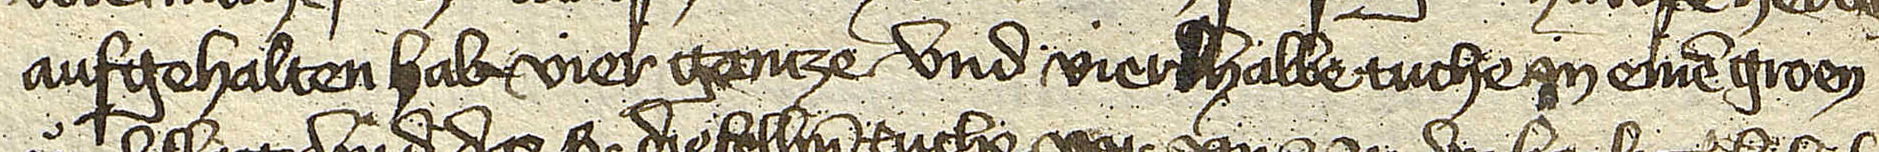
aufgehalten hab vier gancʒe / vnd vier halbe tuche in eine* groen
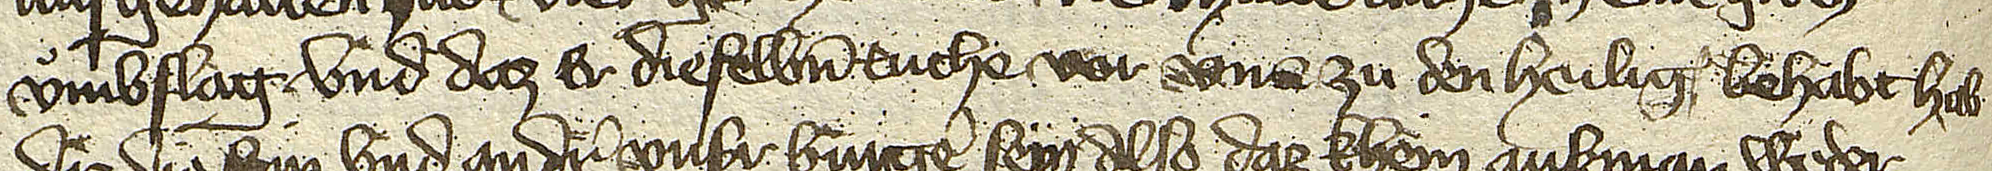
v̈mbſlag / vnd daʒ er dieſelbn* tuche vor vns ʒu den heilig* behabt hab
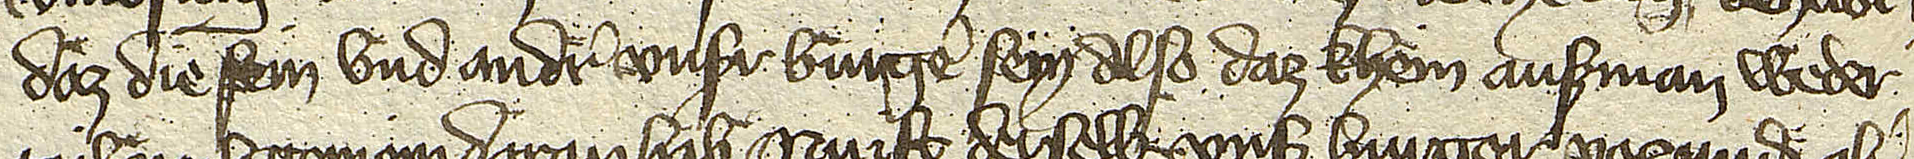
daʒ die ſein vnd andr* vnſ*r burge* ſein Alſo daʒ khein auſʒman weder
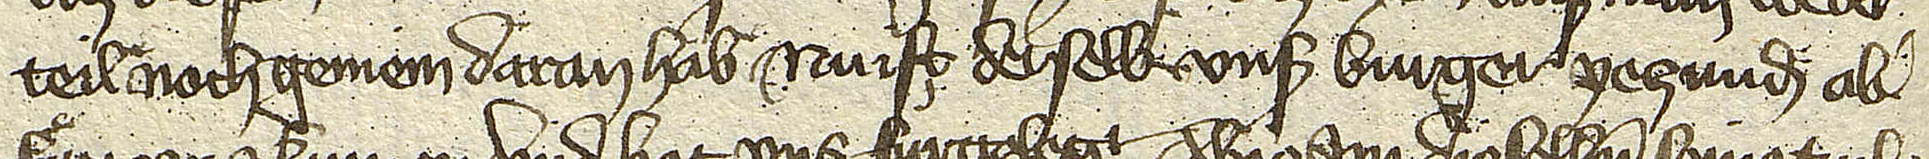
teil noch gemein daran hab / Nu iſt derſelb unſ* burger yecʒund* ab*
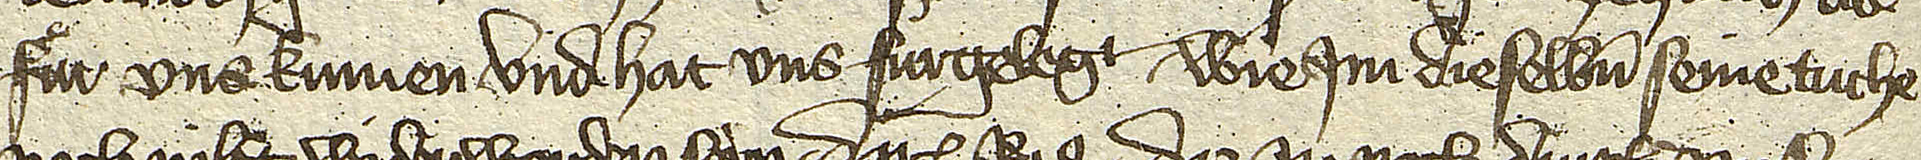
für vns kumen / vnd hat vns furgelegt / wie Im dieſelbn* ſeine tuche
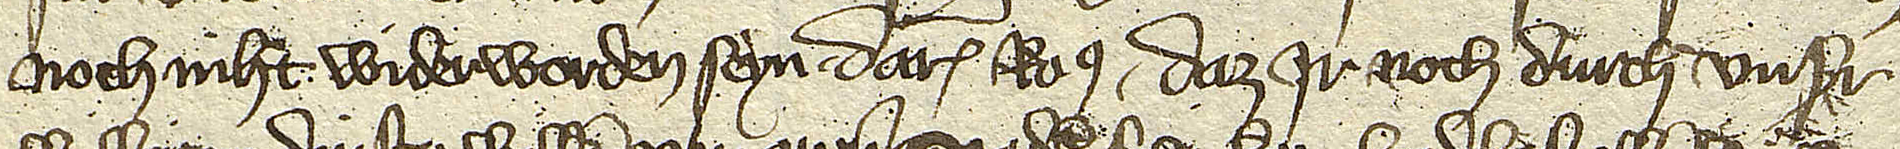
noch niht widerworden ſeyn / Dar* Ro* / daʒ Ir noch durch vnſ*r
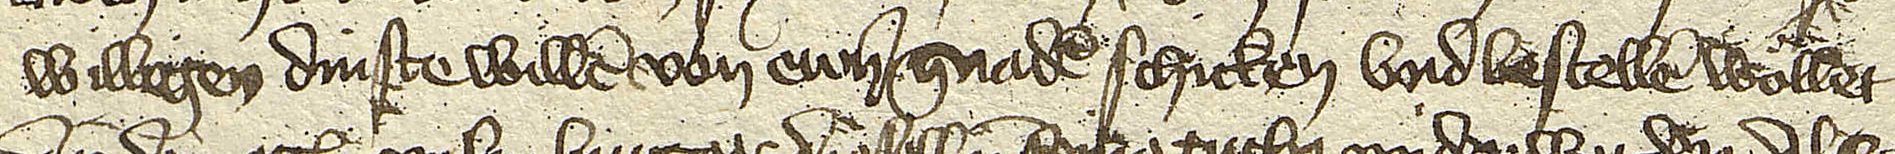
willigen dinſte wille* von ewn* gnad* ſchicken vnd beſtelle* wöllet
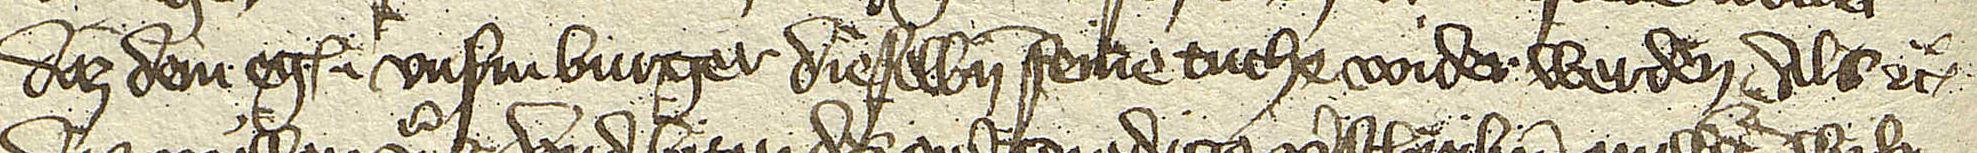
daʒ dem eg* ~ vnſ*m burger dieſelbn* ſeine tuche wider werden / Als ec*
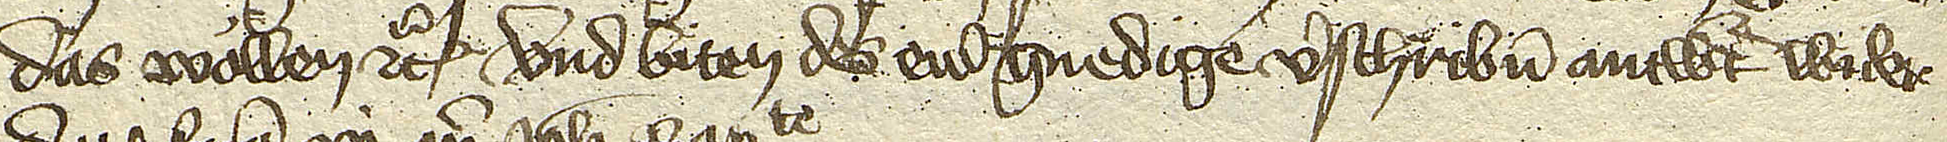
das wöllen ec* / vnd biten des ew* gnedige v*ſchribn* antw*t wider
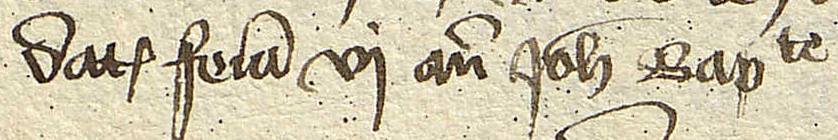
dat* feia* vi an* Ioh* Bap*
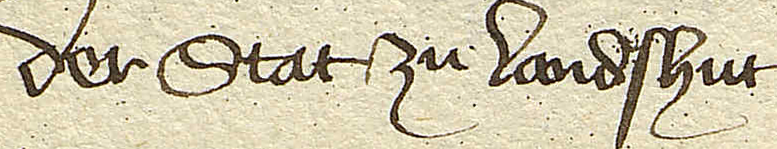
Der Stat cʒu Landſhut
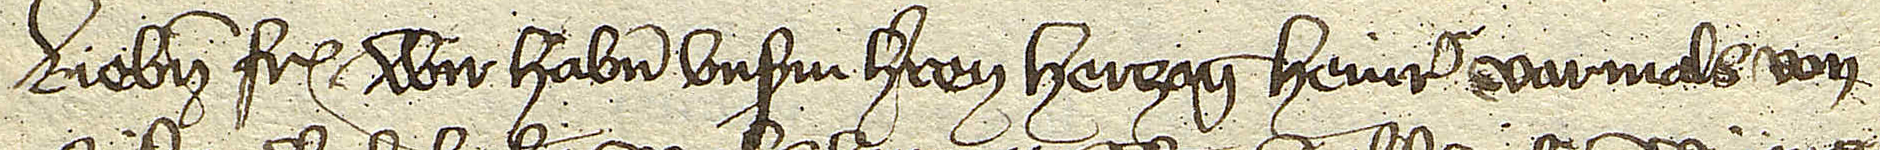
Liebn* fr* / Wir habn* vnſ*m h*ren hercʒog heinr* vormals von
